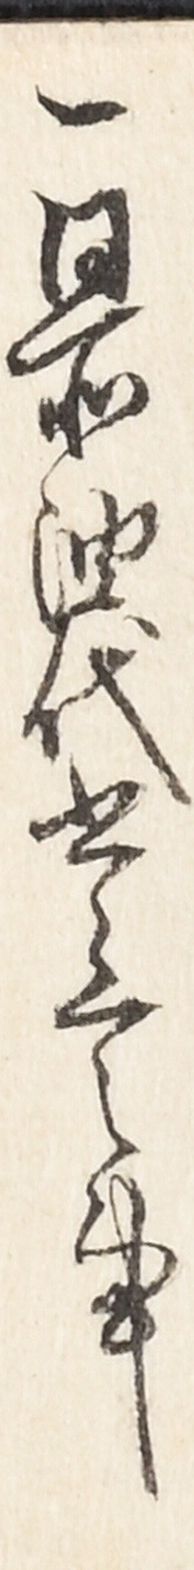一同所油代書上之事

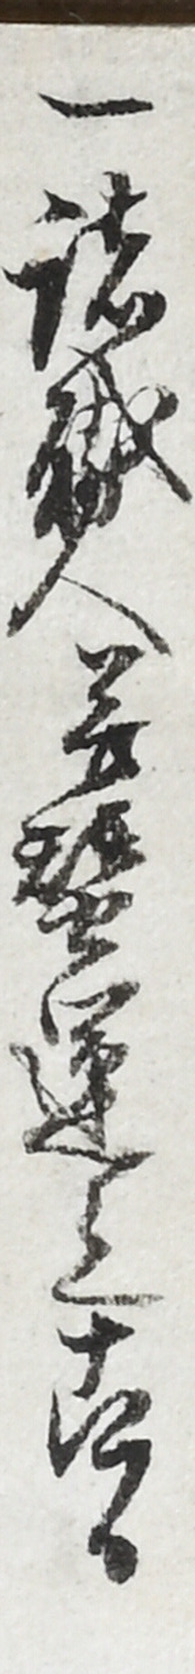一諸職人并替運上十四日
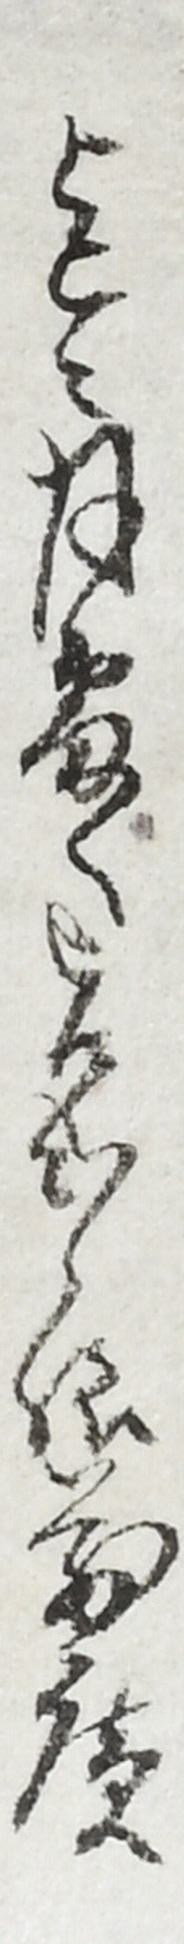迄々月番へ差出候様前廣
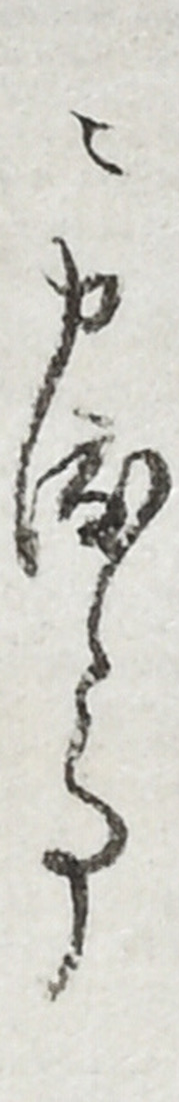ニ申渡候事
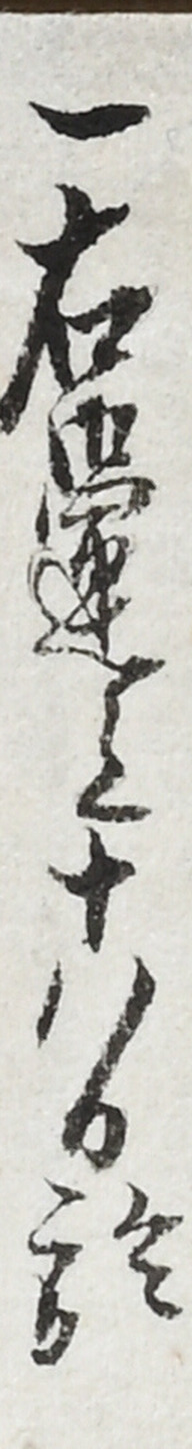一右御運上十八日於
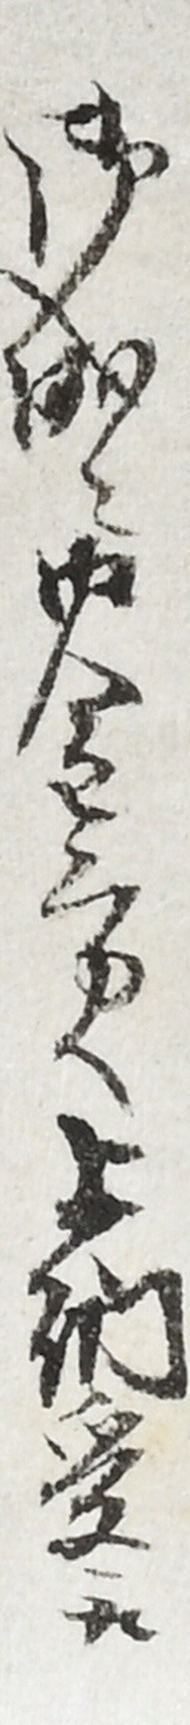御成ニ御金方へ上納受取
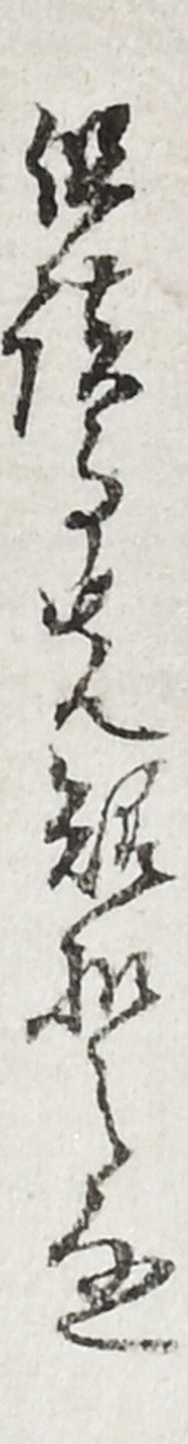但談事先規扣之通
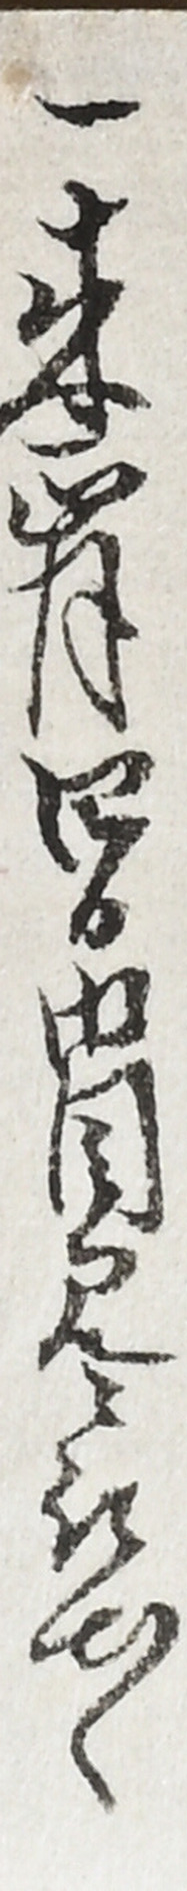一来正月四日御目見ニ被出候
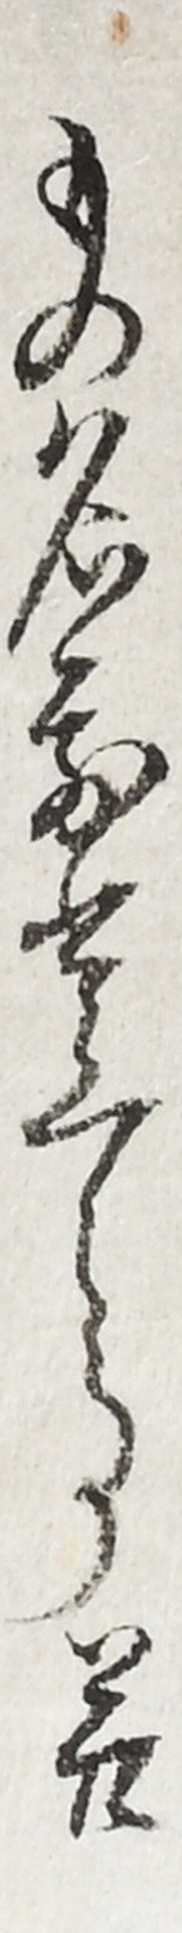もの名前書上之事并
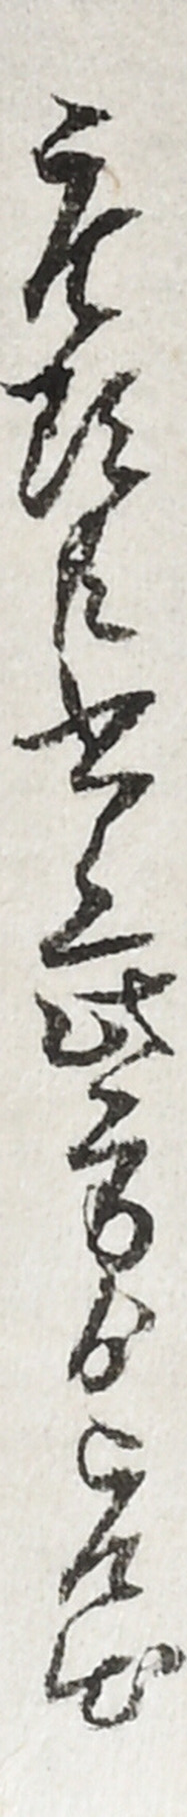座頭共書上此方より差出
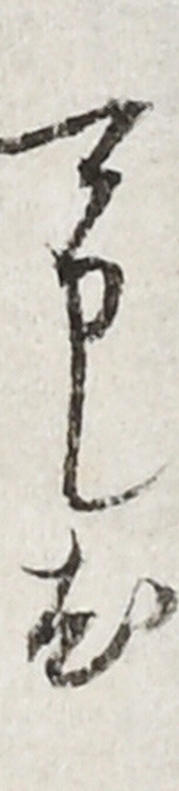可申候尤
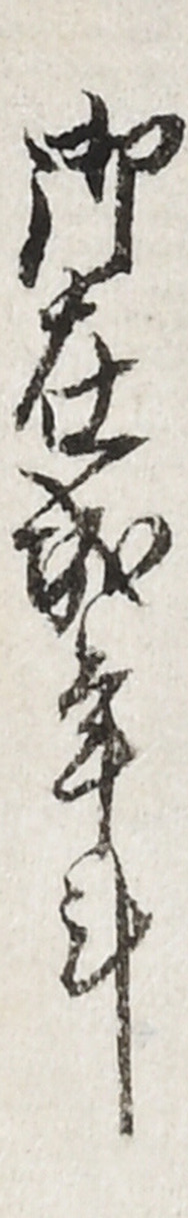御在城年斗
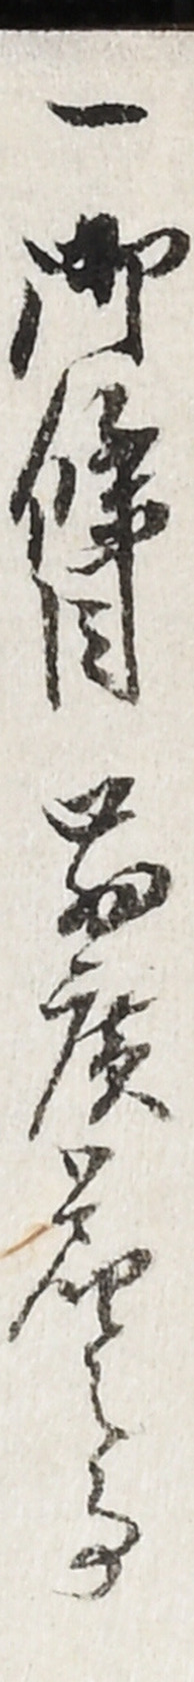一御條目前広御届之事
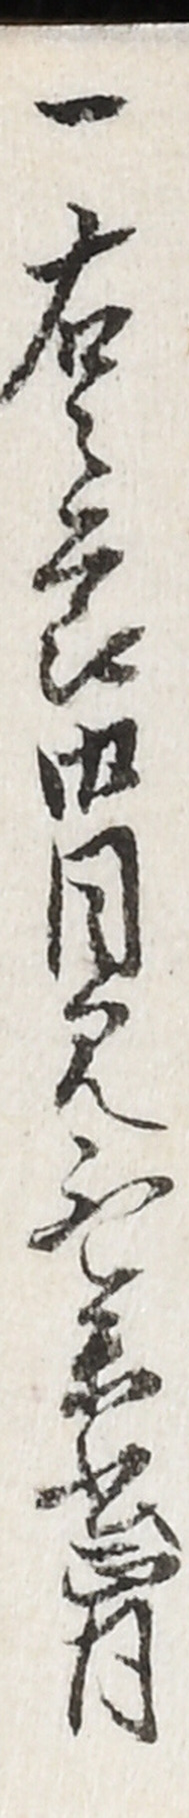一右之節御目見不参出正月
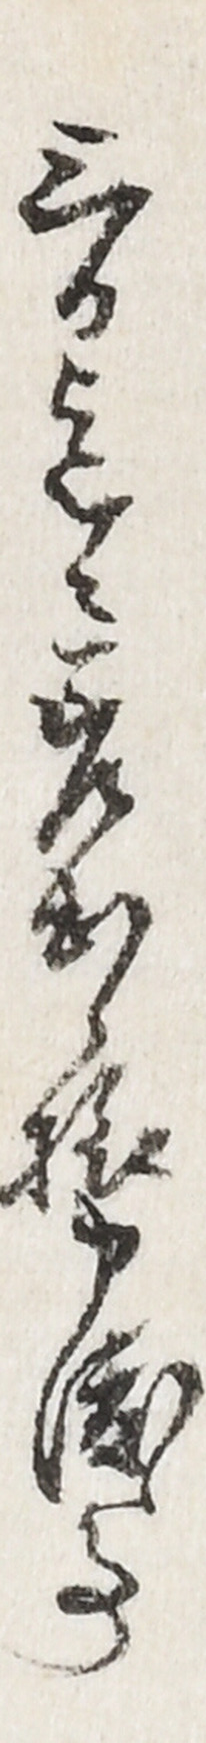三日迄ニ差出候様申渡候事

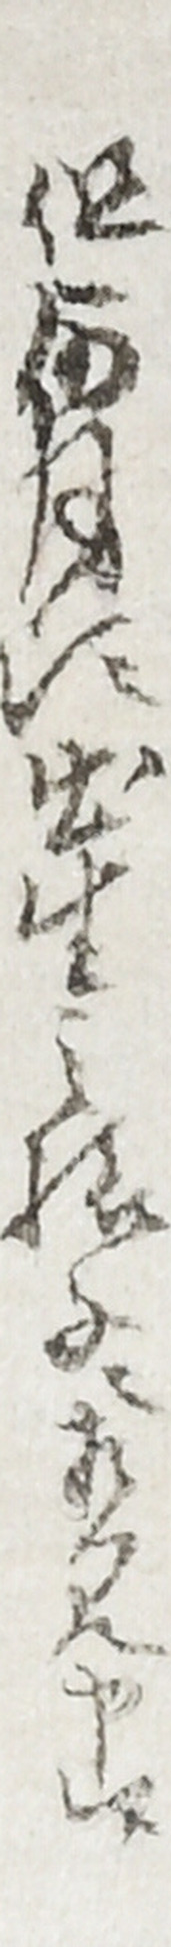但何月頃出生之様子ニ相見申候
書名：年内行事懐中録
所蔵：伊那市立高遠町図書館・合同会社AMANE
